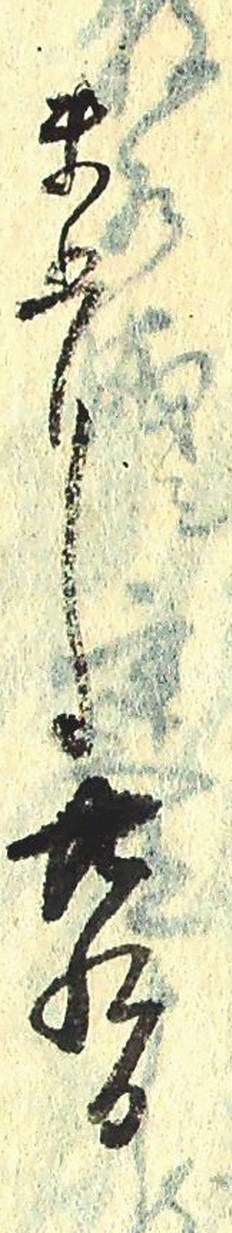未五月廿九日
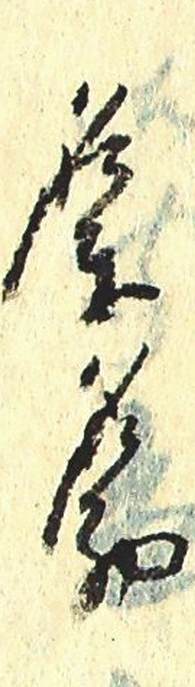名東名西
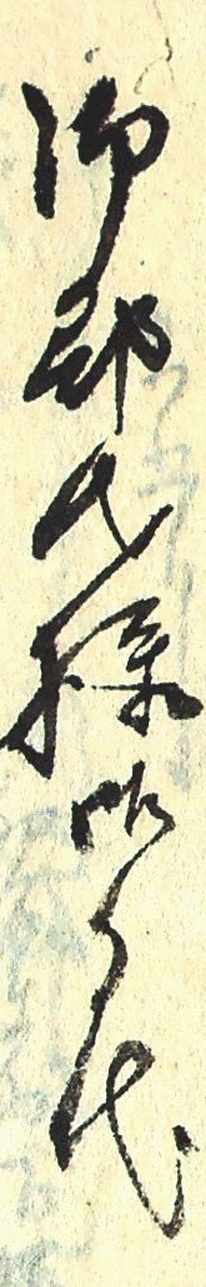御郡代様御手代

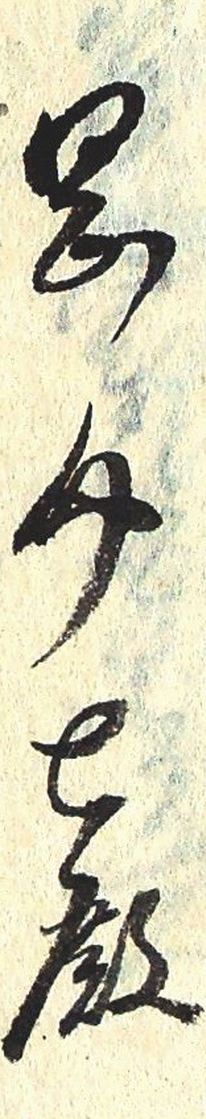岡竹七殿
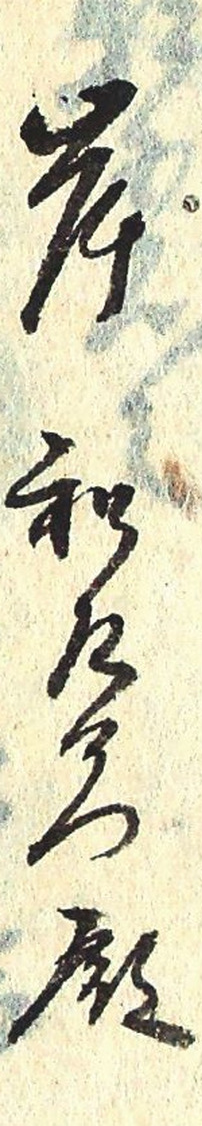岸和左衛門殿
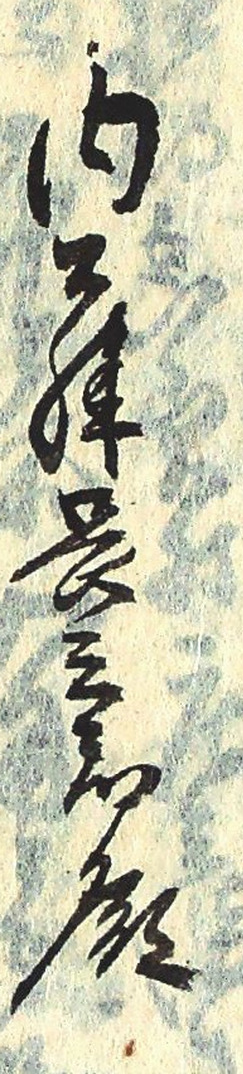内藤長三郎殿
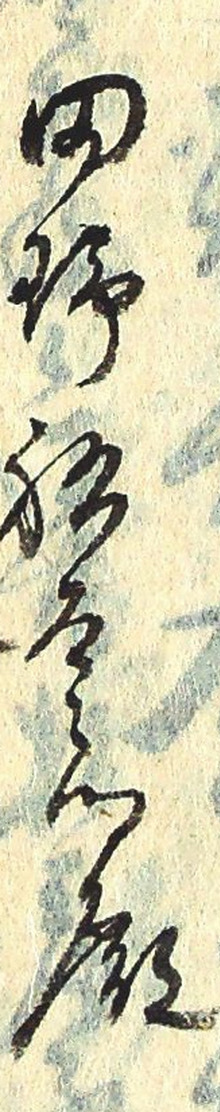田野祐太郎殿
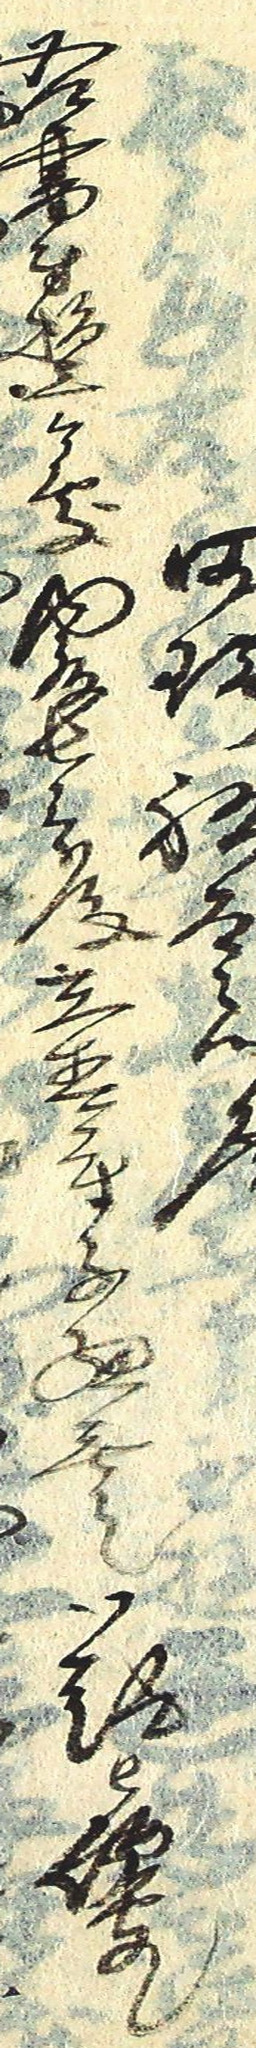右書付奉指上候処内藤長三郎殿立直に付子細無之御趣被仰聞
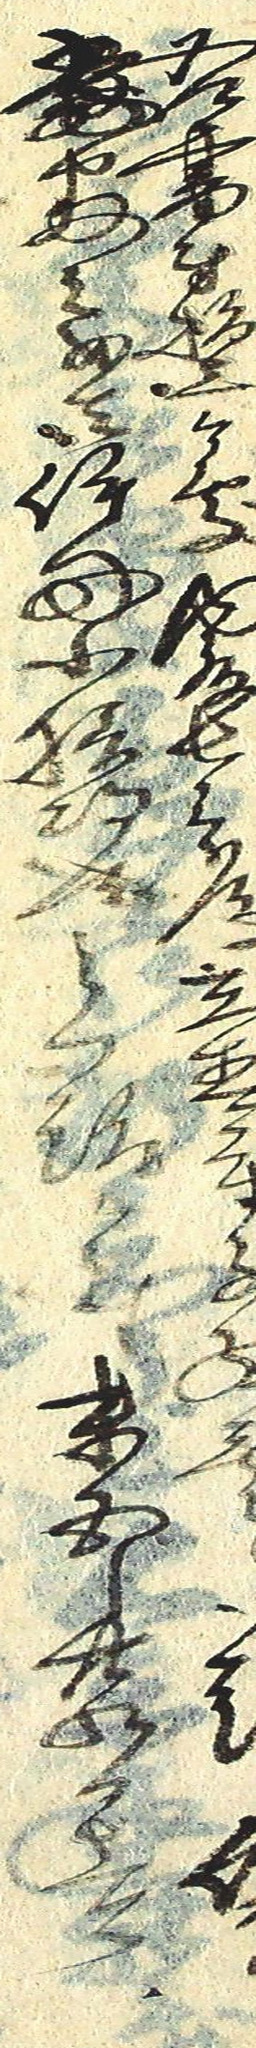裏判之義は伊丹小膳次殿之御趣に付未五月廿九日上る
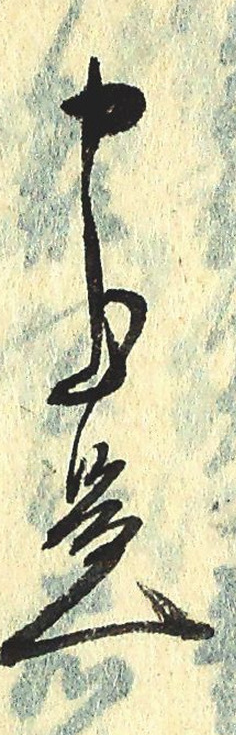申上覚
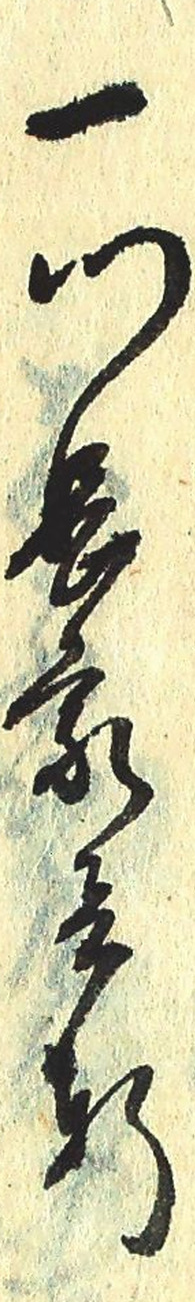一門長家壱軒礎
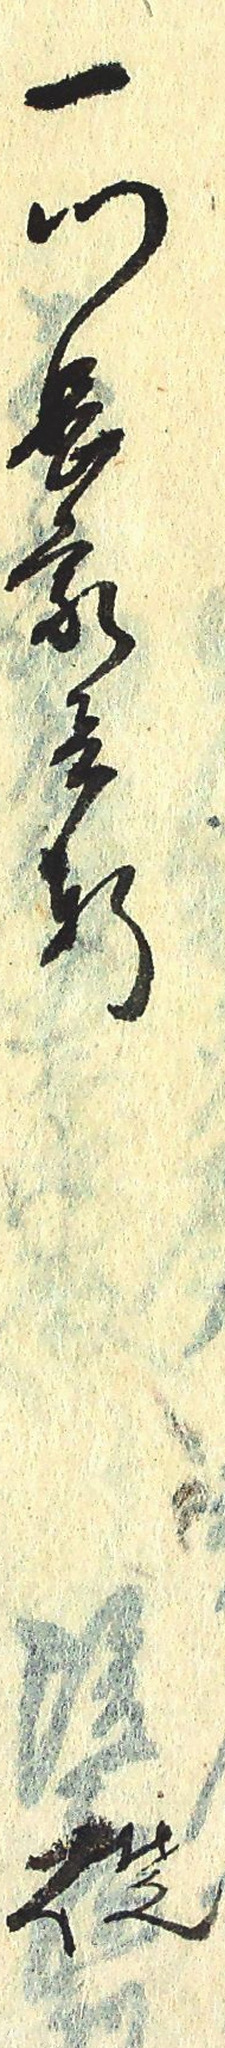一門長家壱軒礎
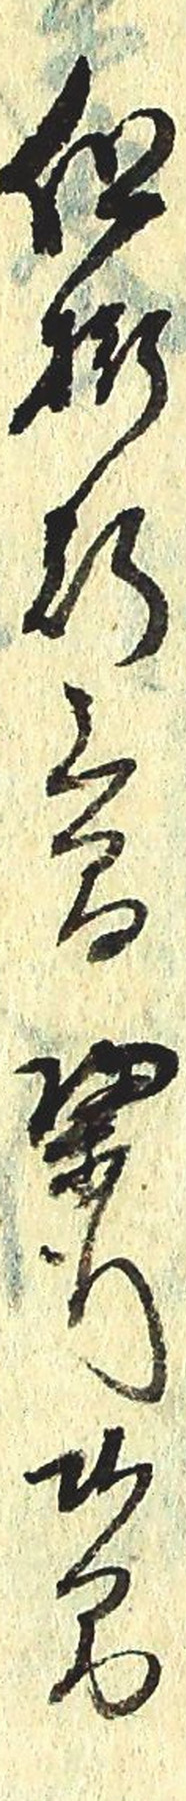但桁行三間梁行弐間
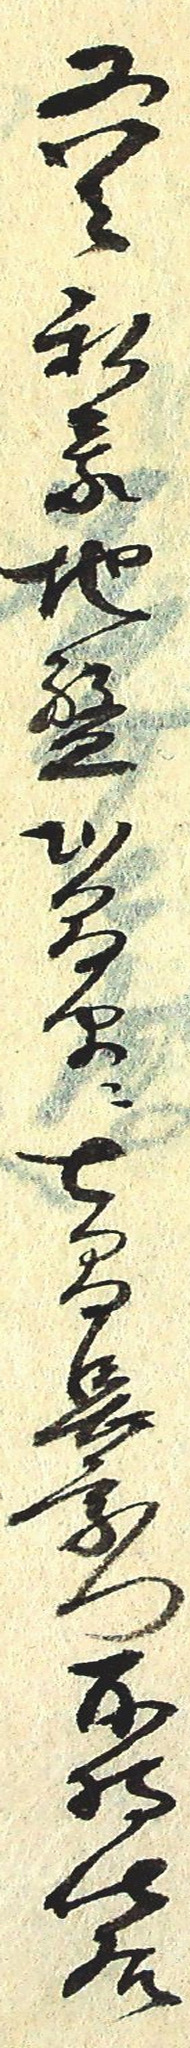右は私義地盤弐間半に七間長家門所持仕居
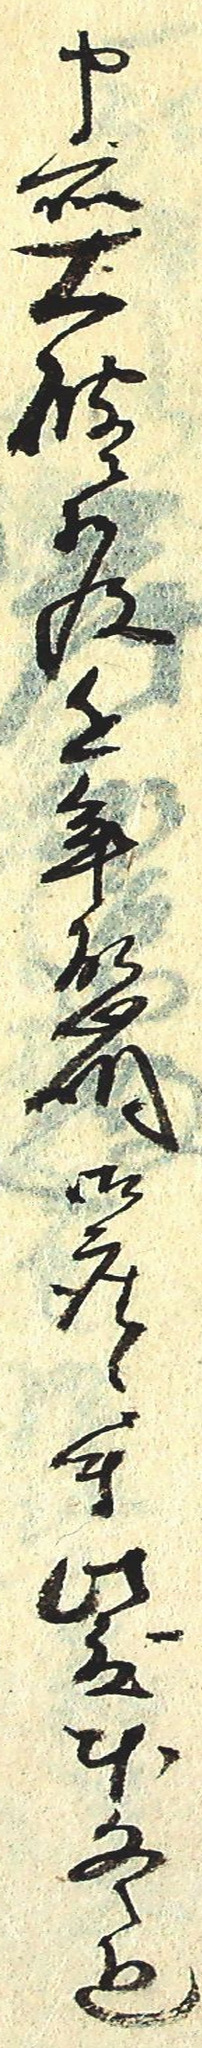申所大破に相及近年取崩御座候に付此度本文之通
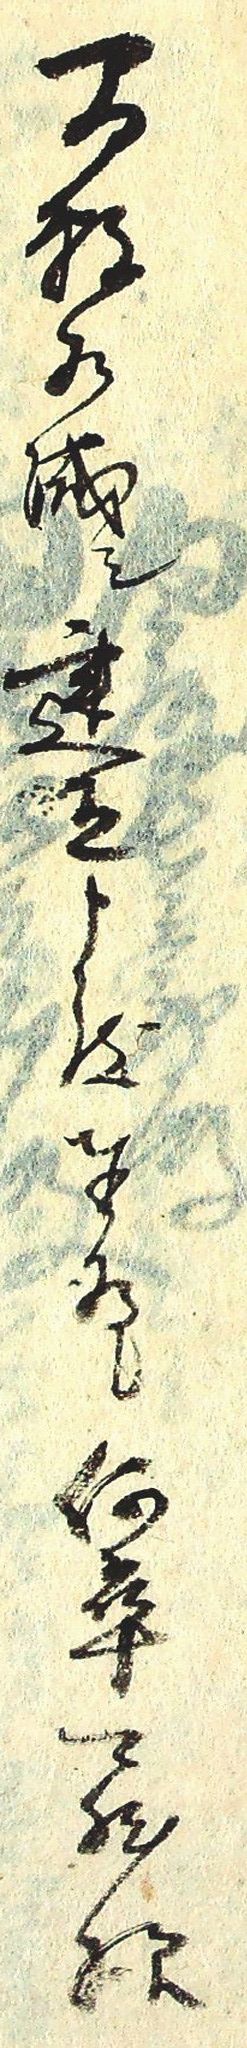間数相減し建直申度奉存候何卒可然様
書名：諸御願書控(弐番）
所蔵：鳴門教育大学 Naruto University of Education
